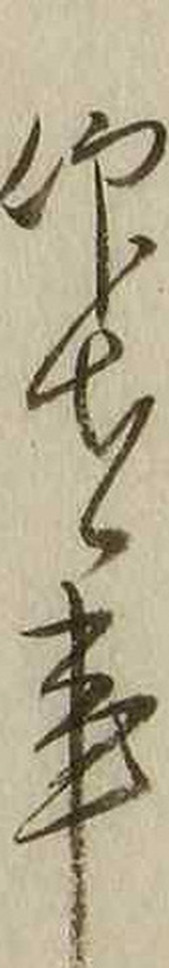仰付候事
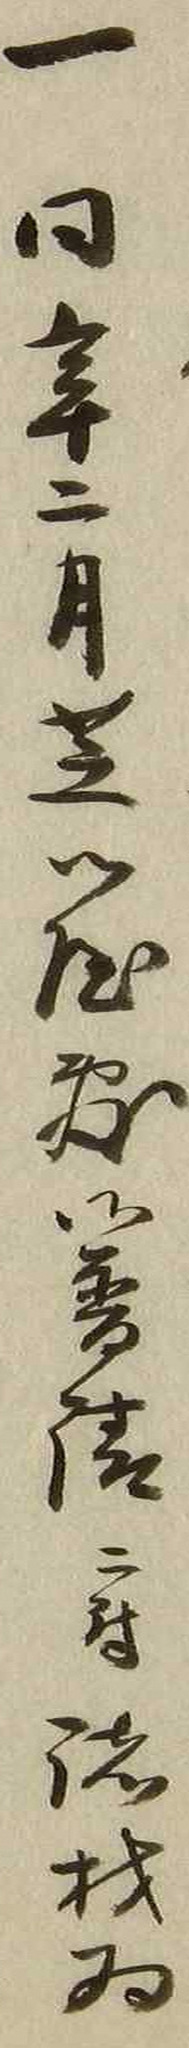一同年二月芝御屋敷御普請ニ付諸材為
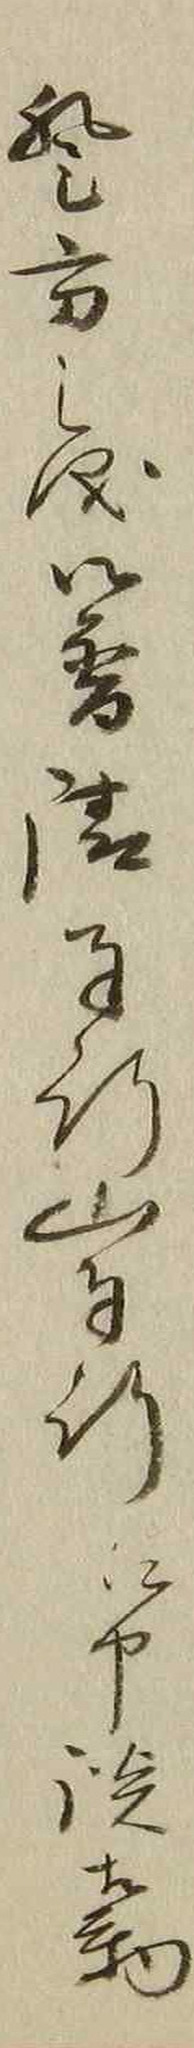登方之儀御普請奉行山奉行江申談相勤
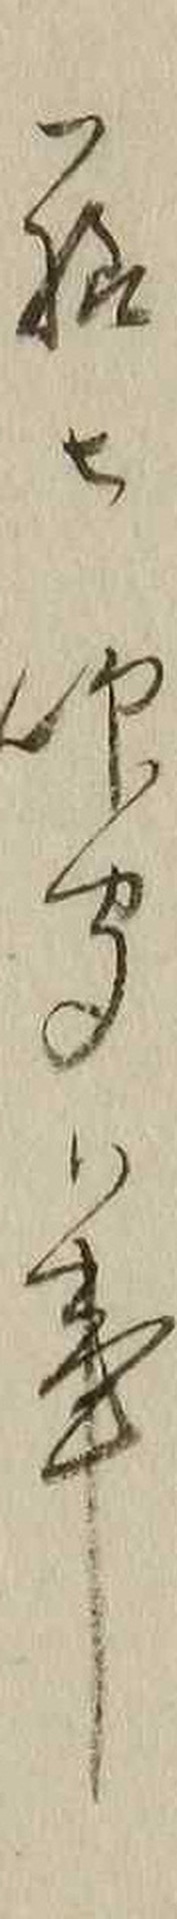候様被仰聞候事
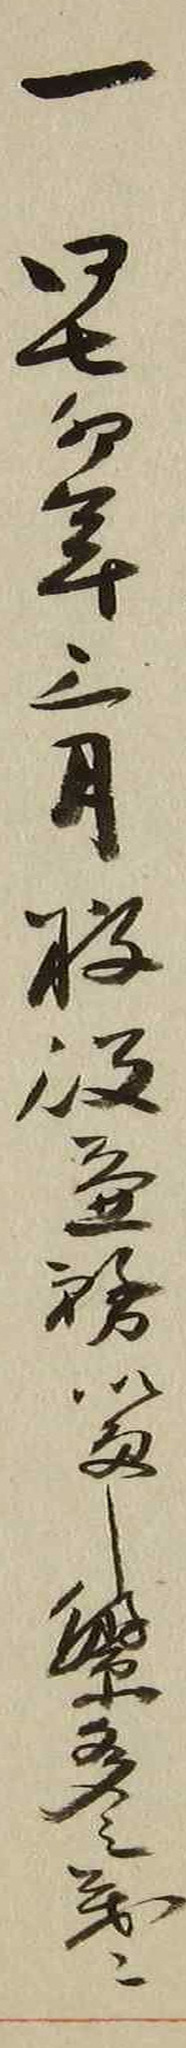一同七卯年三月数役兼務いたし繁多之義ニ
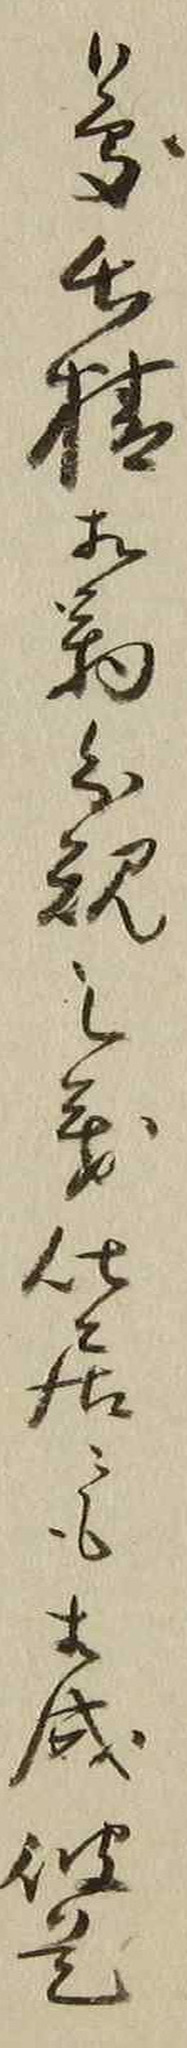候処出精相勤分規之義仕居ニも相成彼是
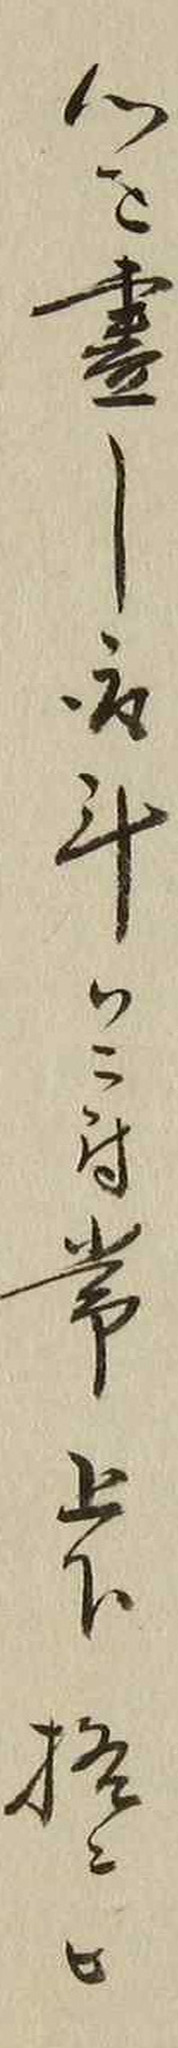心を尽し取計候ニ付上下格ニ被
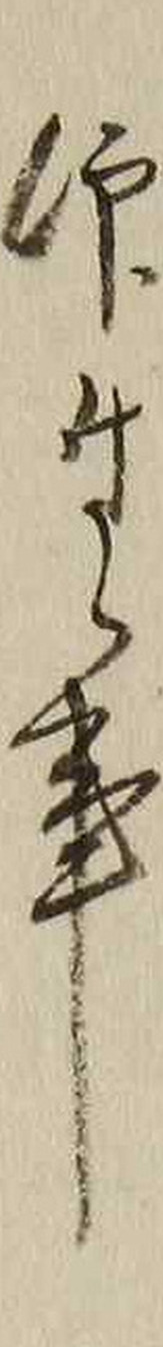仰付候事
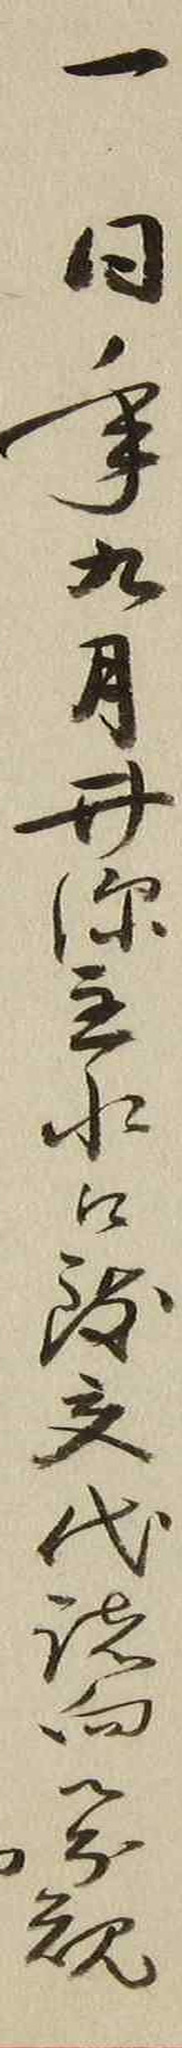一同年九月井深主水江致交代諸向御分規
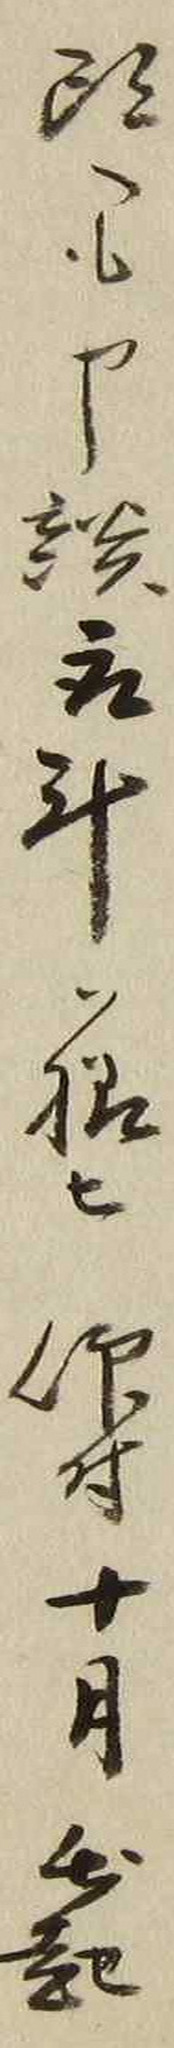頭へも申談取計候様被仰付十月出起
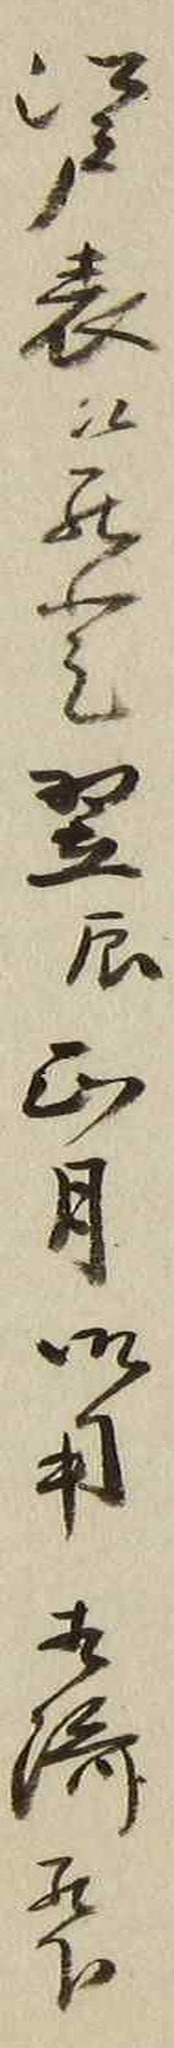江戸表江罷登翌辰正月御用相有済罷下
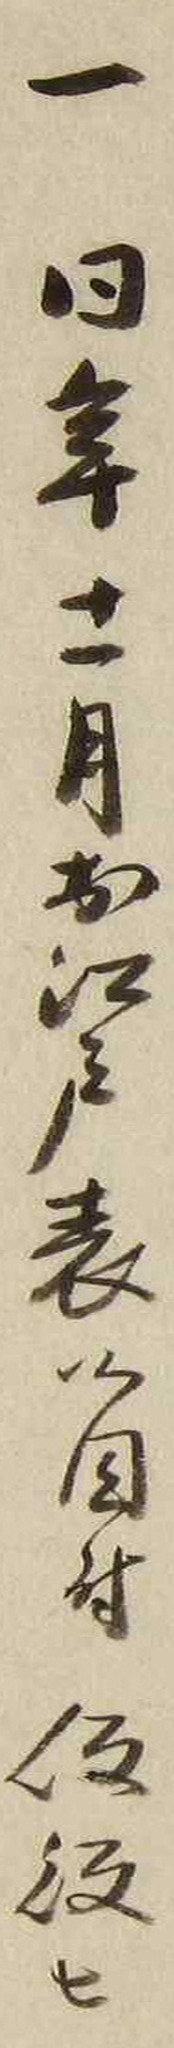一同年十一月於江戸表御目付仮役被
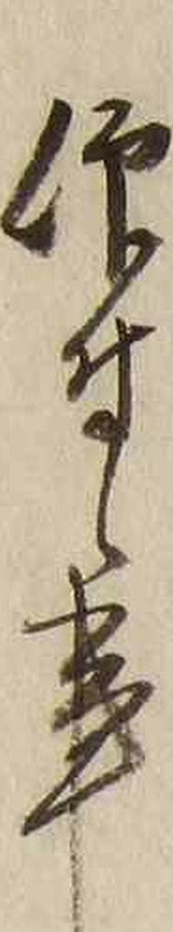仰付候事

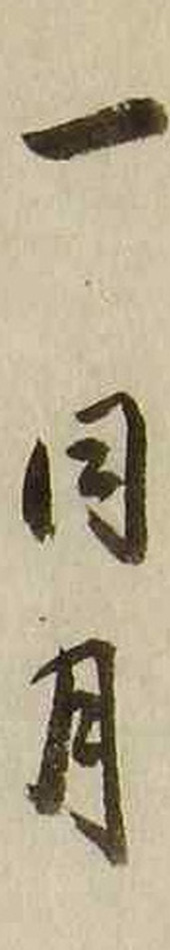一同月
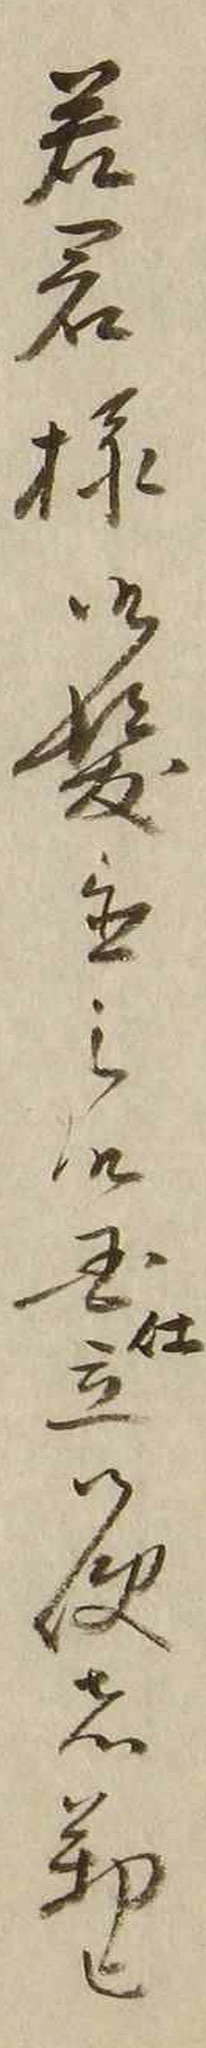若君様御髪置之御国仕立御使者勤被
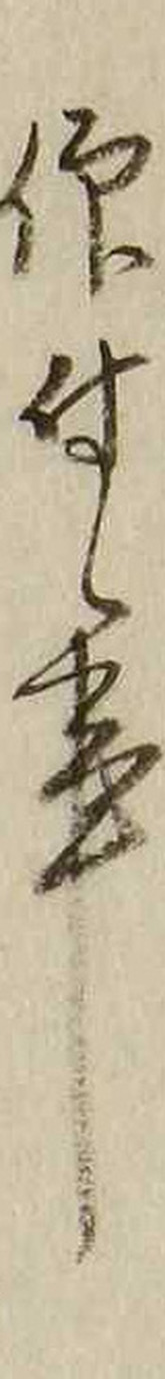仰付候事
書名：諸士系譜　巻之311　し之部1
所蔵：会津若松市立会津図書館
